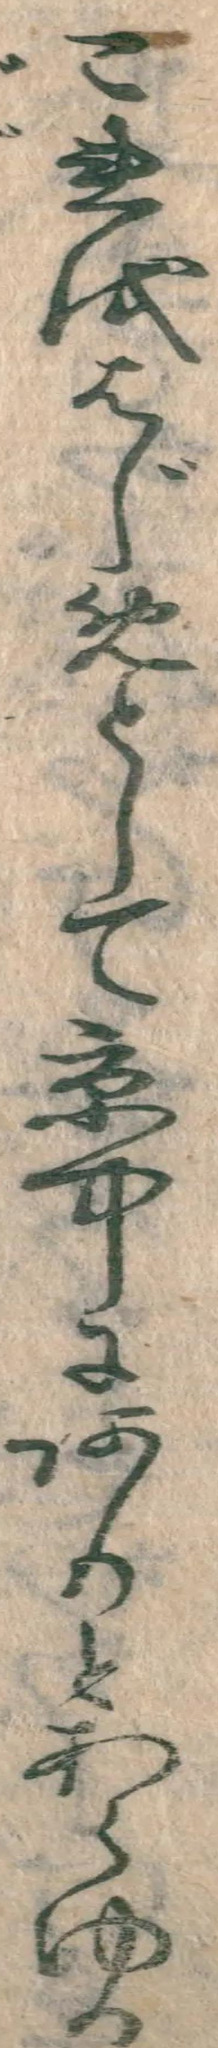これをはじめとして京中にありとあらゆる
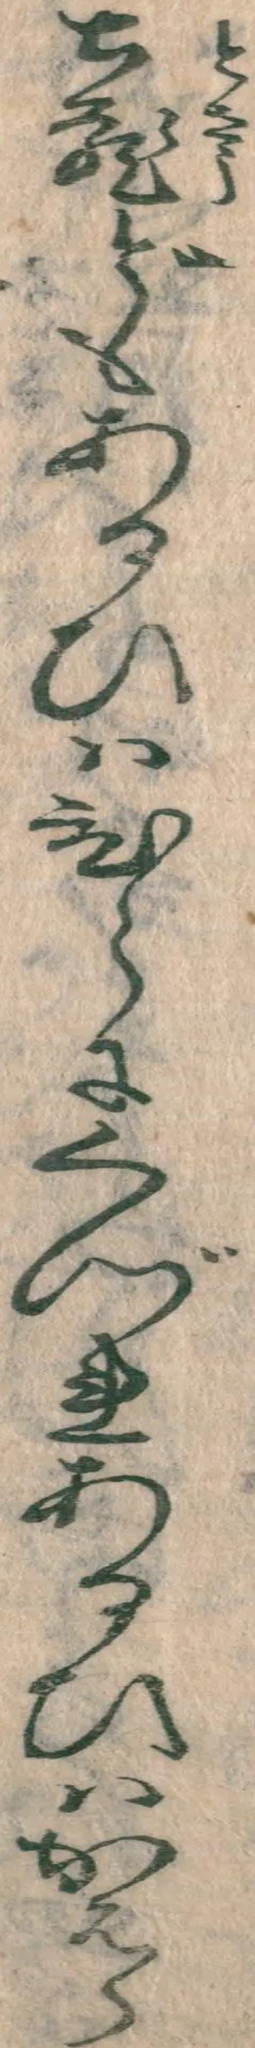土蔵どもあるひはひらにくづれあるひはかはら
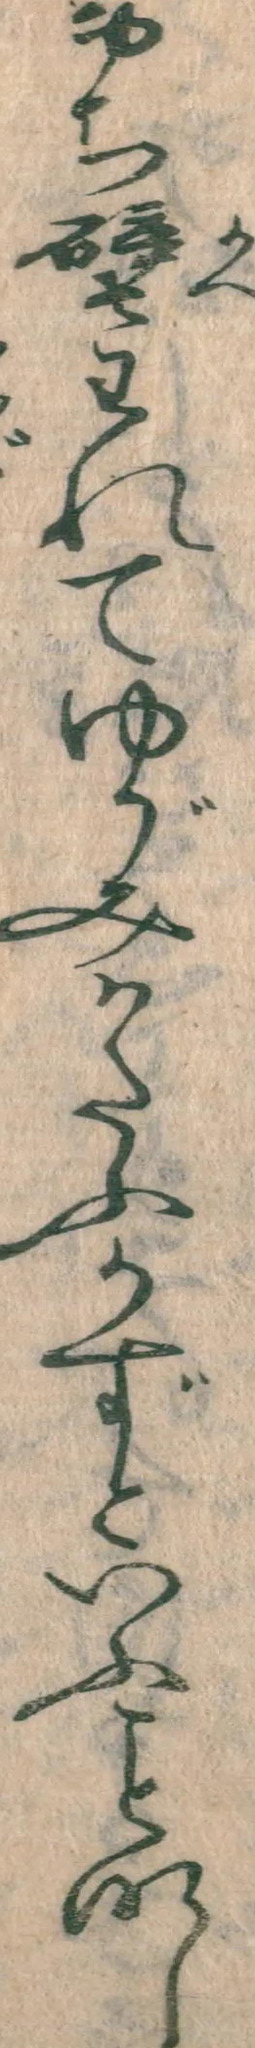おち壁われてゆがみかたふかずといふことなし
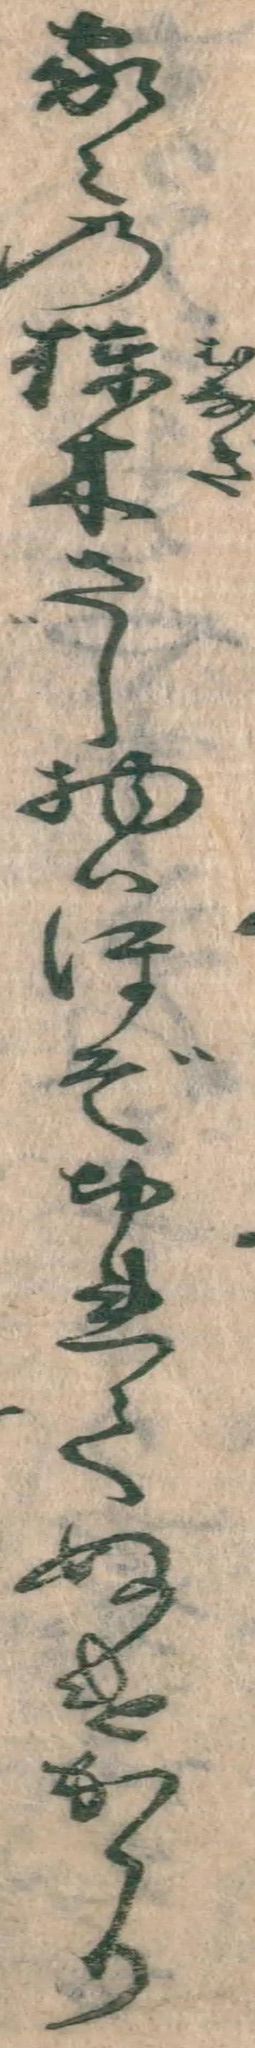家々の棟木さし物はほぞおれてぬけかゝり
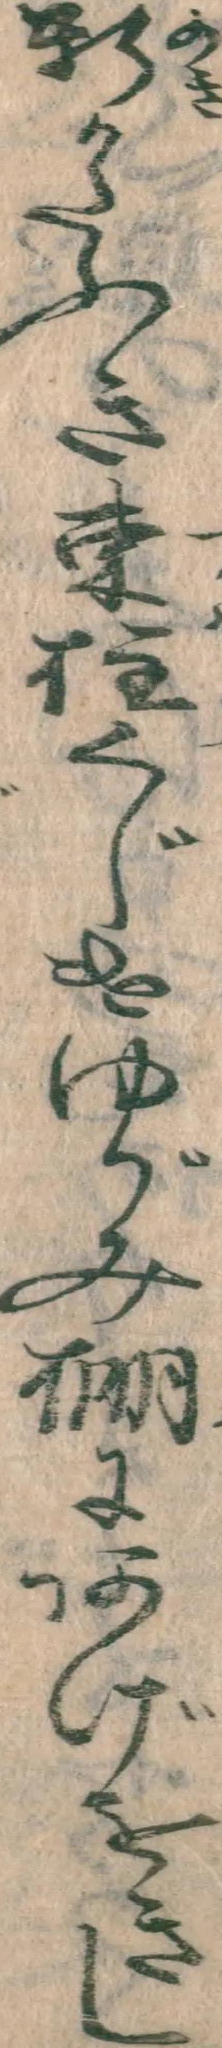軒かたふき束柱くじけゆがみ棚にあげをきし
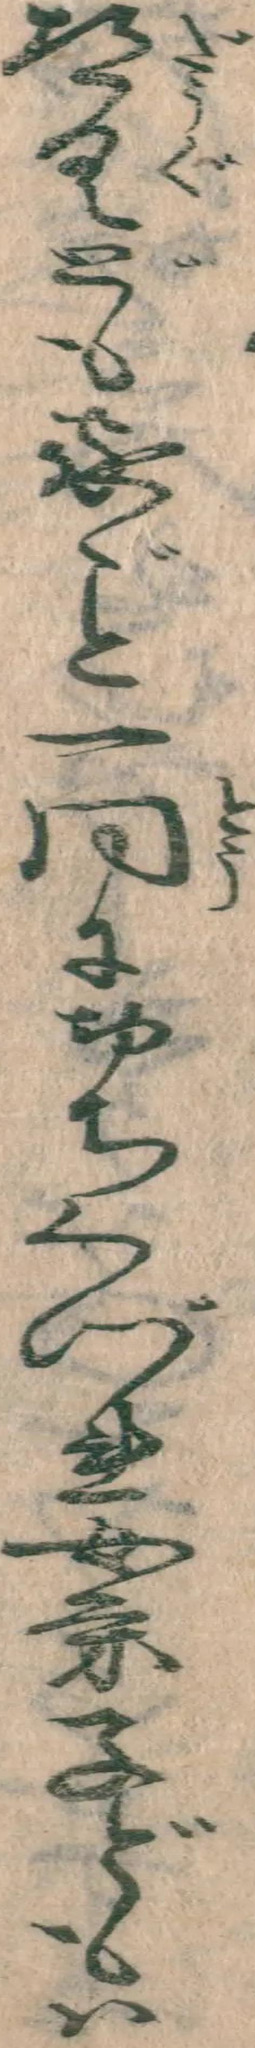道具ども家ごと一同におちくづれ女房子どもは
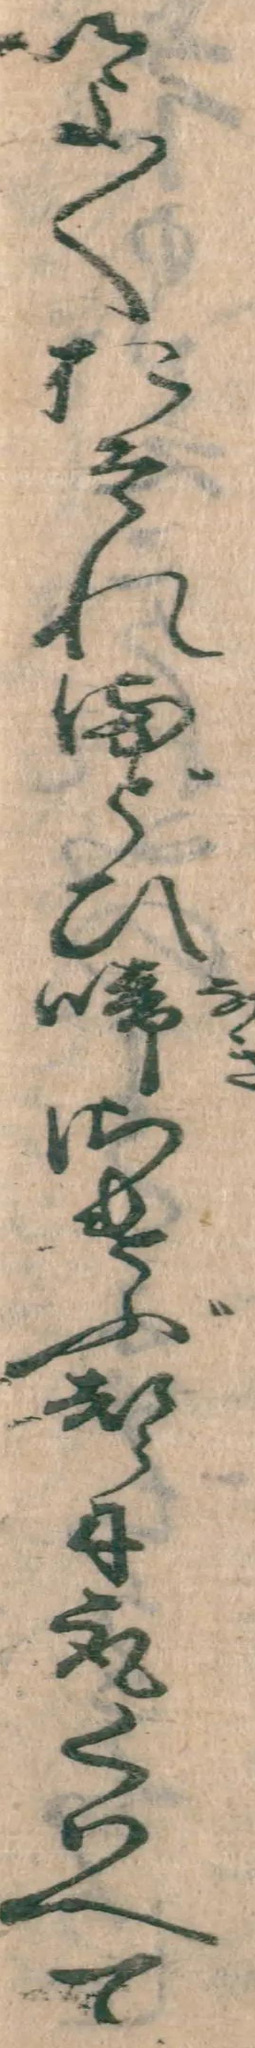いよ〳〵おそれまどひ啼さけぶ聲に瓦くはえて
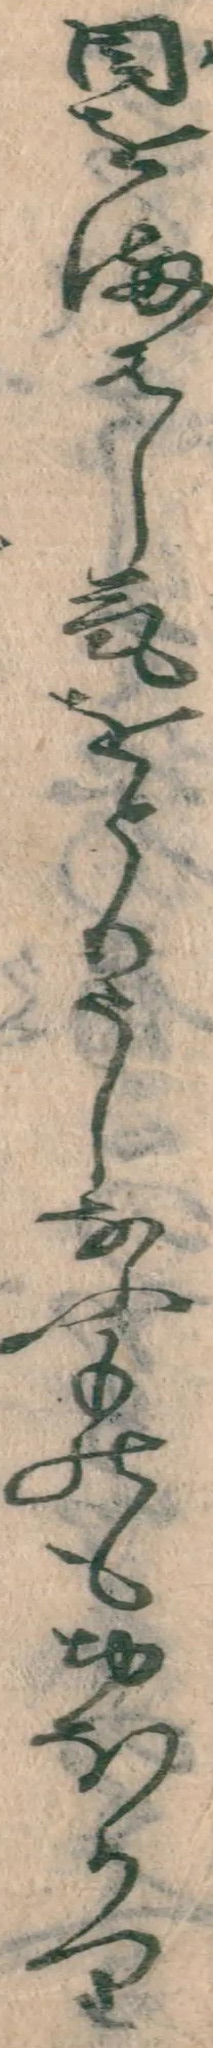目をまはし気をとりうしなふものもおほかり
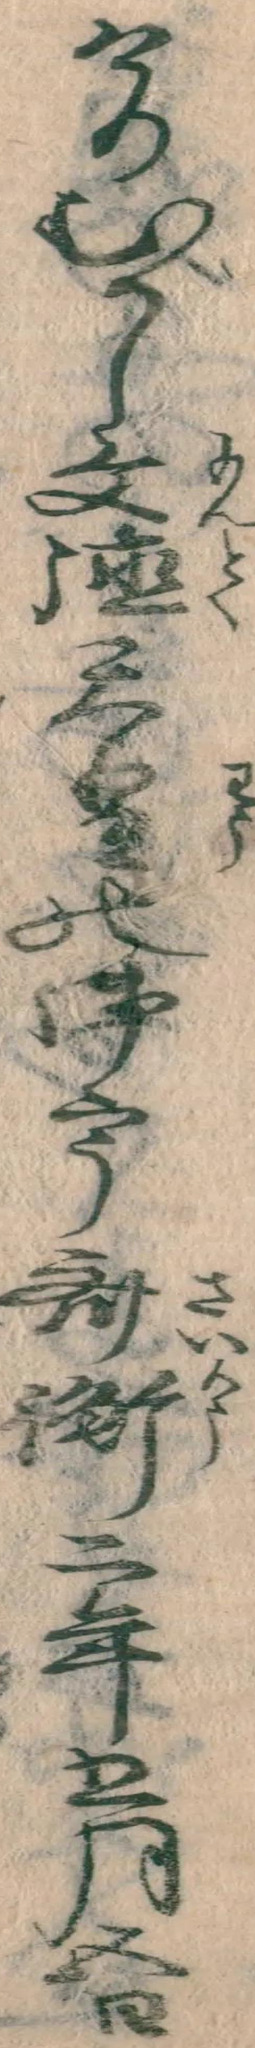けりむかし文徳天皇の御宇斎衡二年五月五日
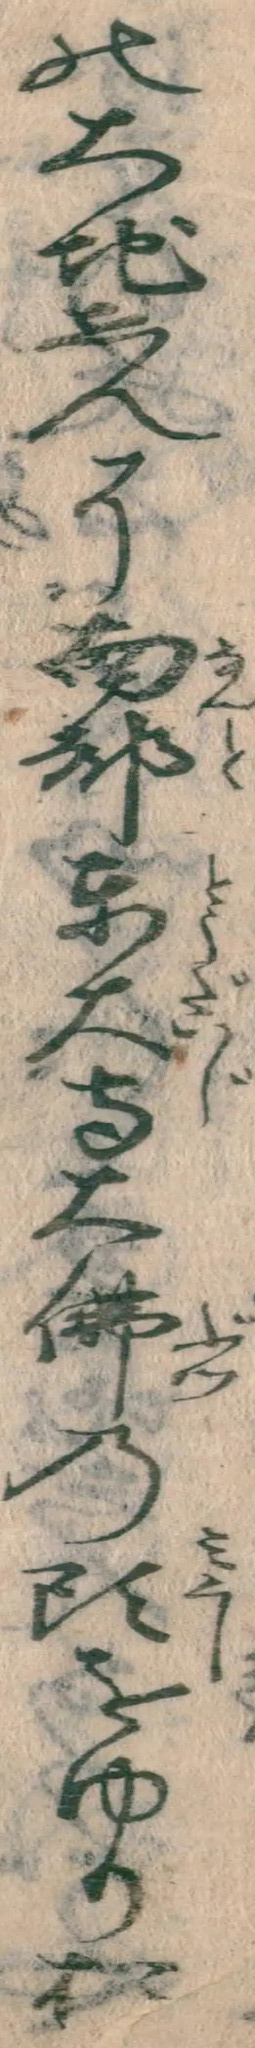の大地しんに南都東大寺大佛の頭をゆりお
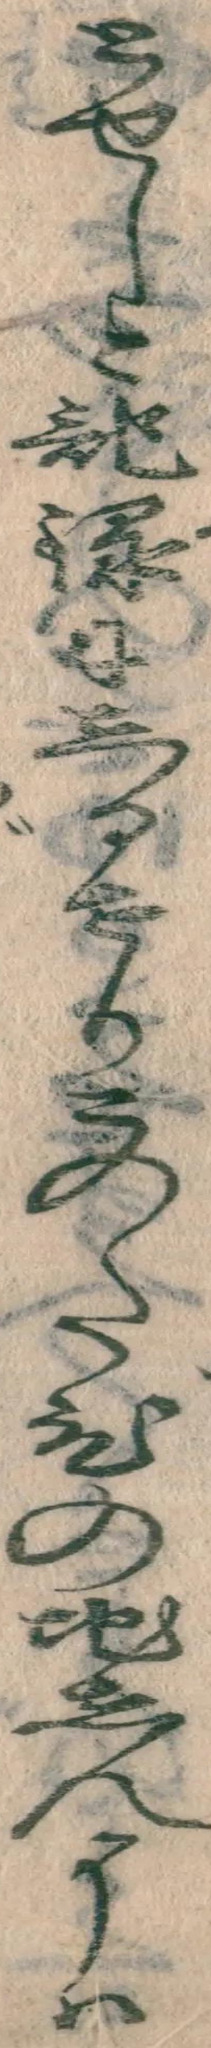とせしと記録にしるせりこのたびの地しんには
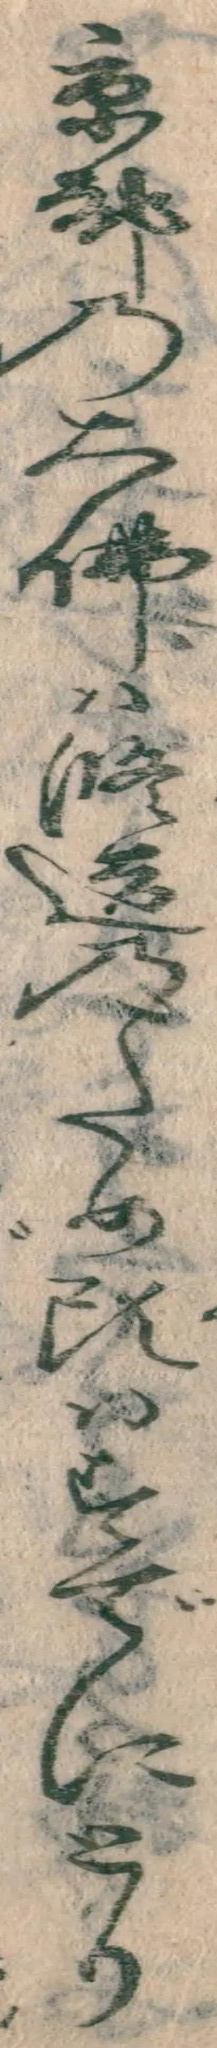京都の大佛は修造のため頭はすでにとり
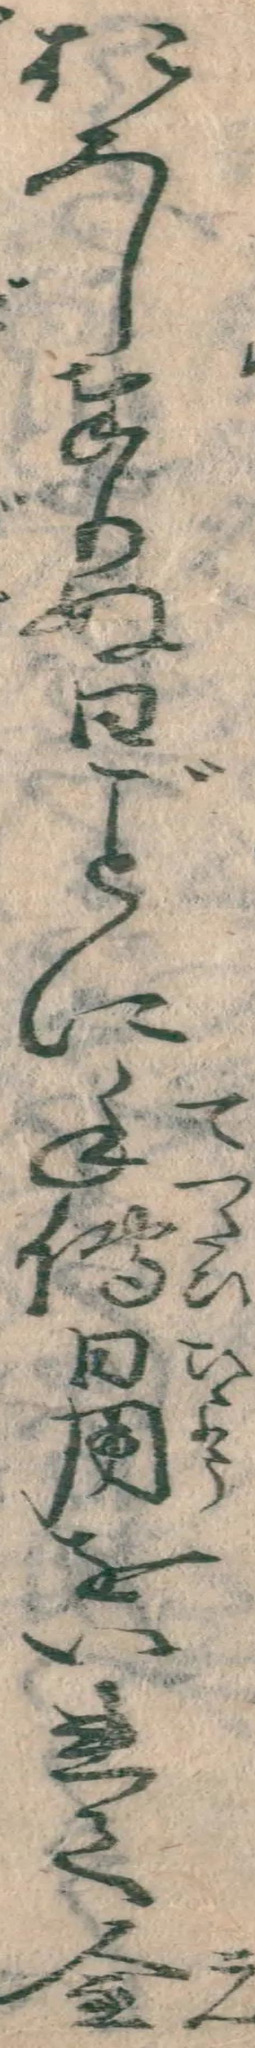おろし奉りぬ日ごとに手傳日用をいれてきん金
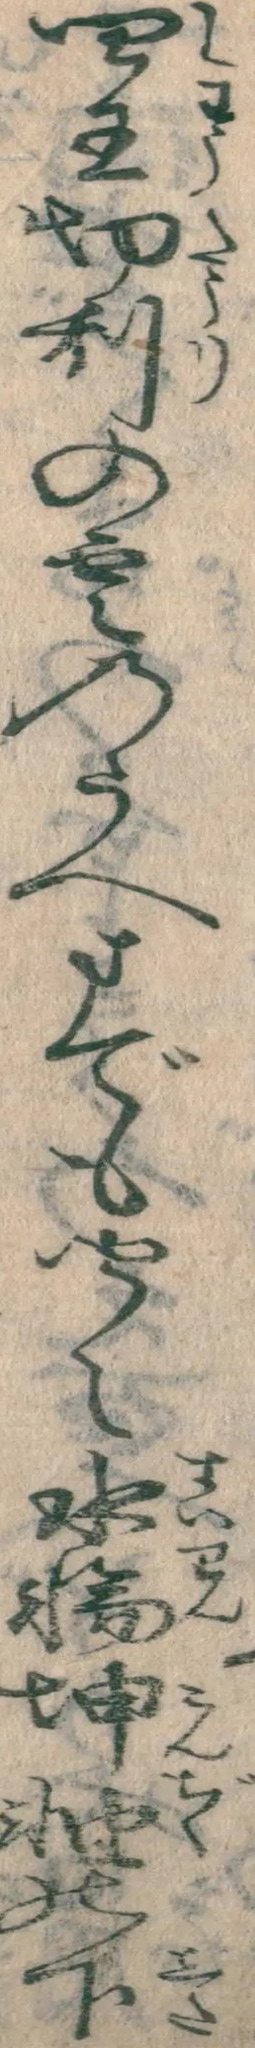四王忉利の雲のうへまでも聞え水輪坤軸の下
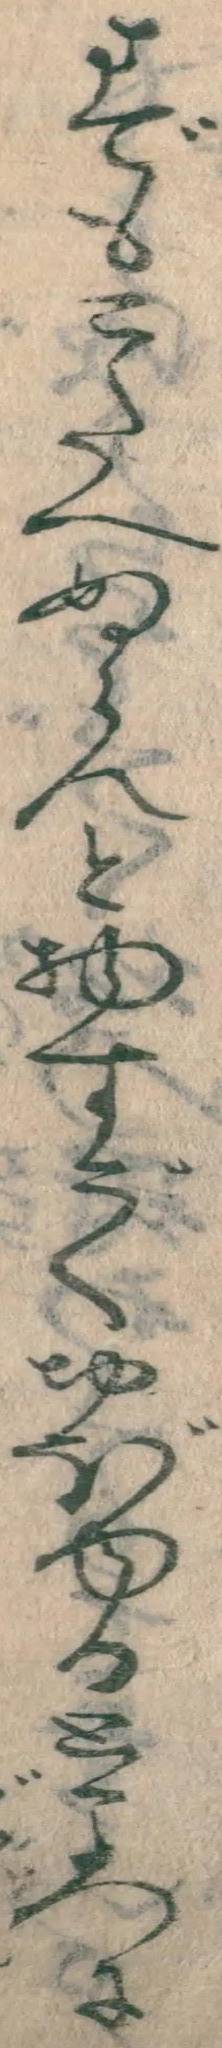までもこたへぬらんと物すごくおぼゆるところに
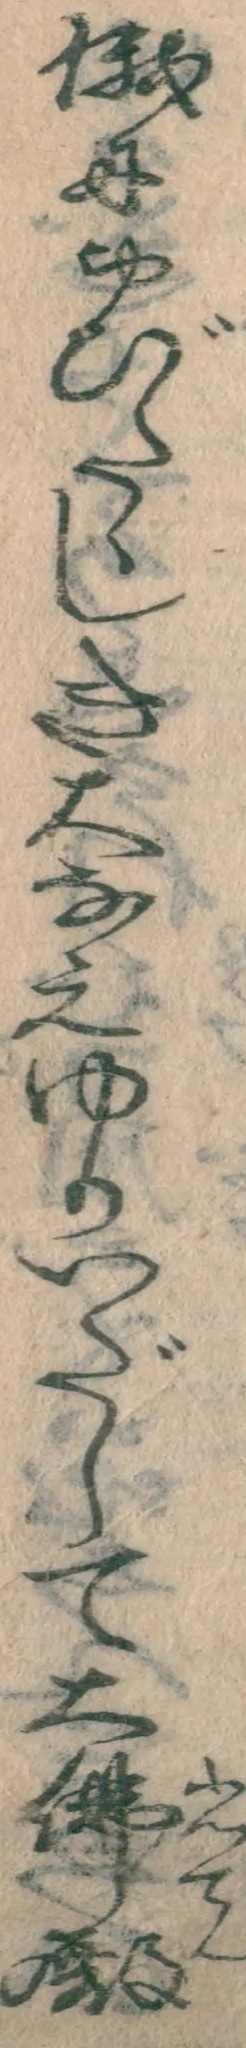俄におびたゝしき大なえゆりいだして大佛殿
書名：艱難目異志. 上,下
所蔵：国立国会図書館 National Diet Library, JAPAN
